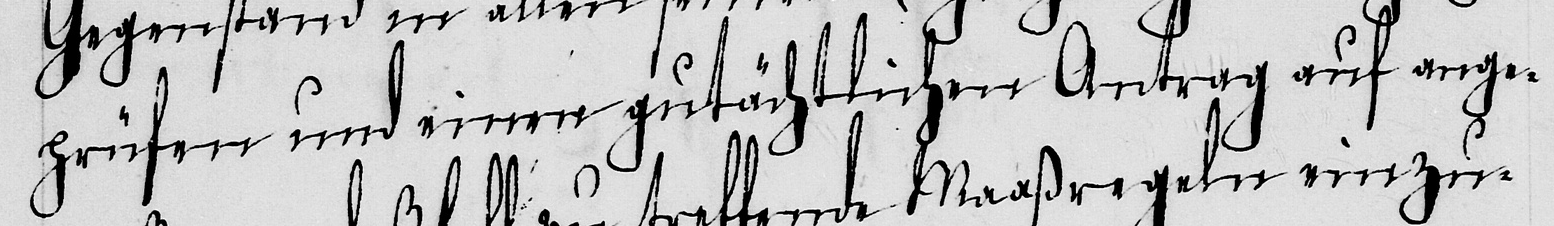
prüfen und einen gutächtlichen Antrag auf ange¬
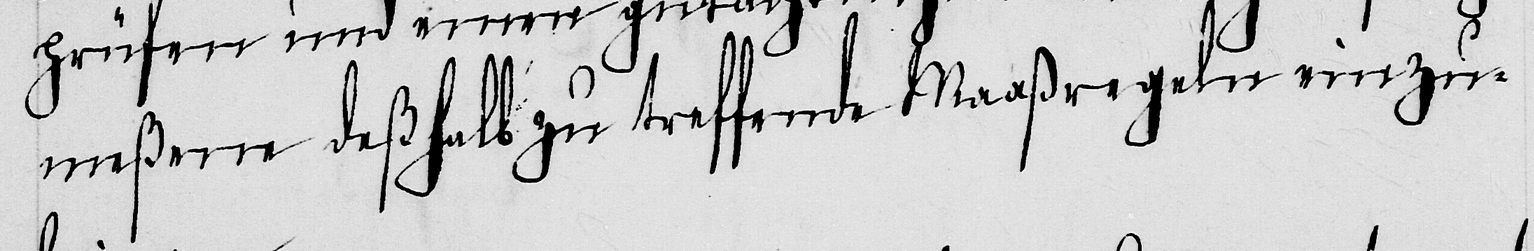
meßene deßhalb zu treffende Maaßregeln einzu¬
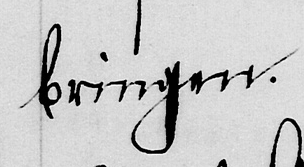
bringen.
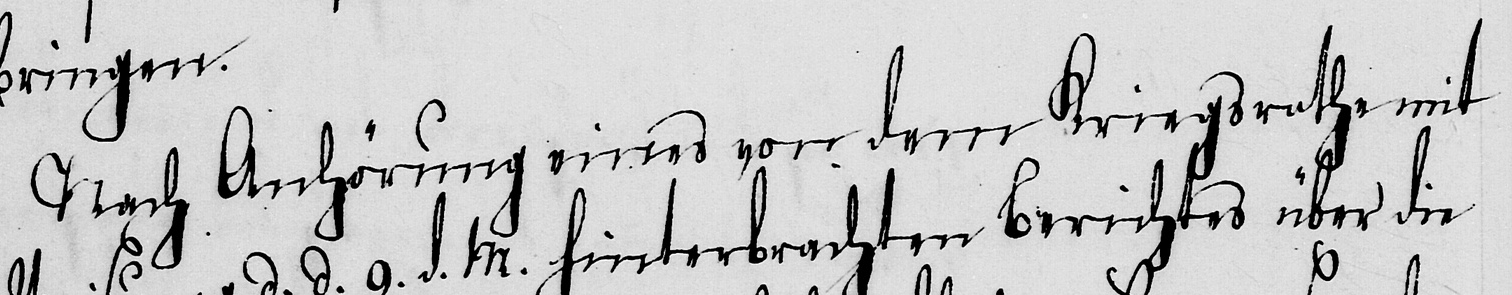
Nach Anhörung eines von dem Kriegsrathe mit
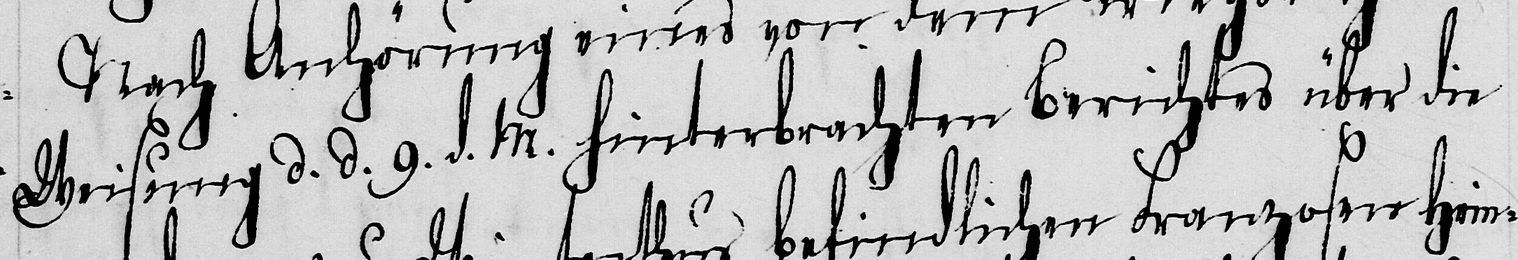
Weisung d. d. 9. d. M. hinterbrachten Berichtes über die
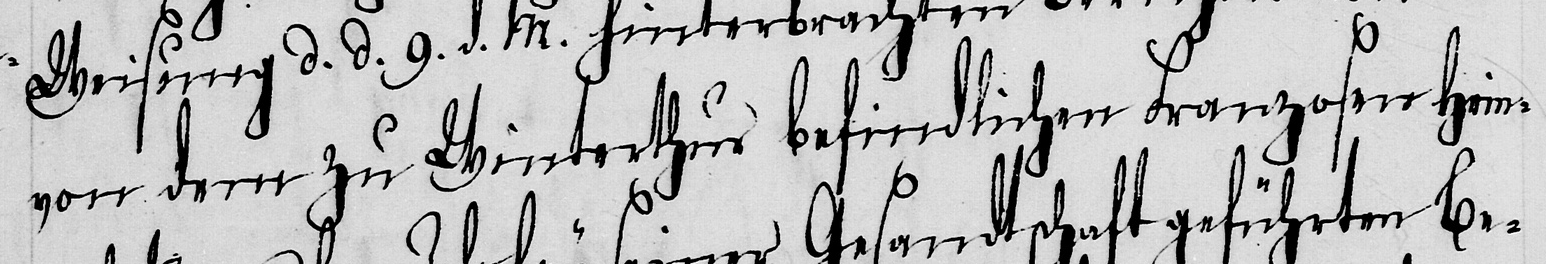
von dem zu Winterthur befindlichen Franzosen Hein¬
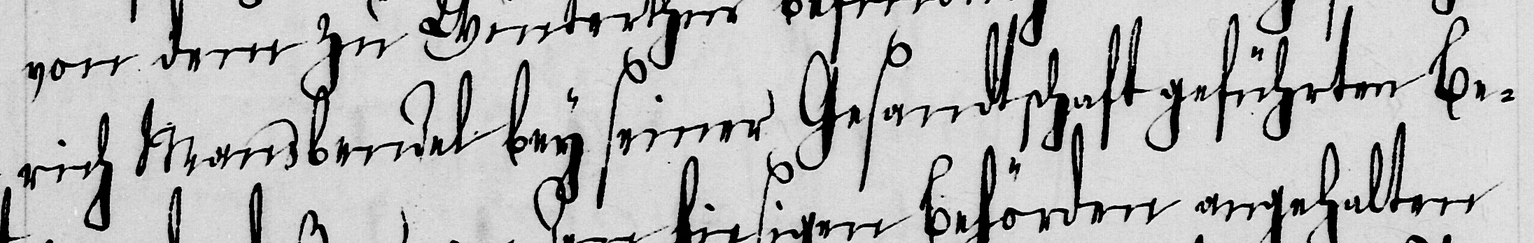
rich Mansbendel bey seiner Gesandtschaft geführten Bes¬
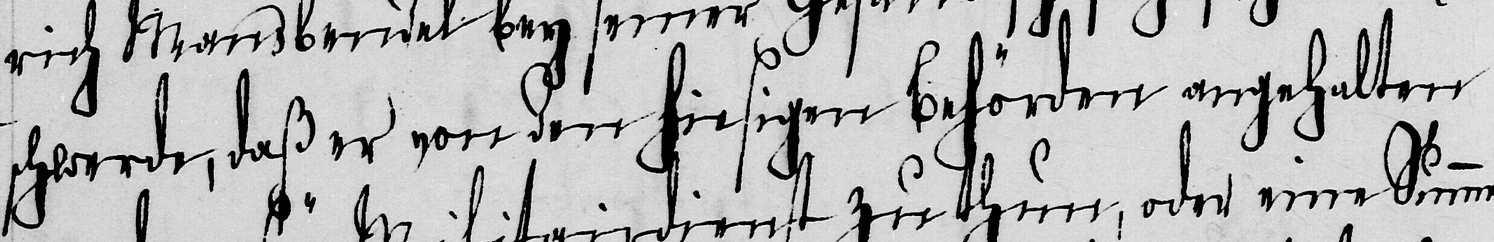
chwerde, daß er von den hiesigen Behörden angehalten
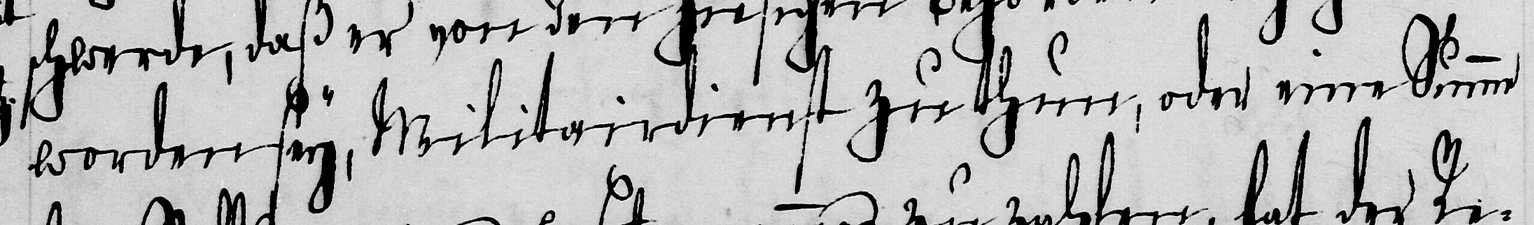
worden sey, Militairdienst zu thun, oder eine Summe
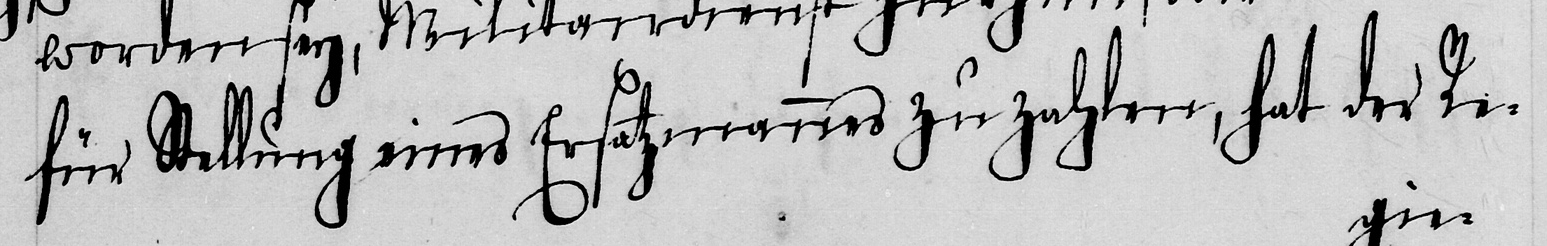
für Stellung eines Ersatzmannes zu zahlen, hat der Re-
